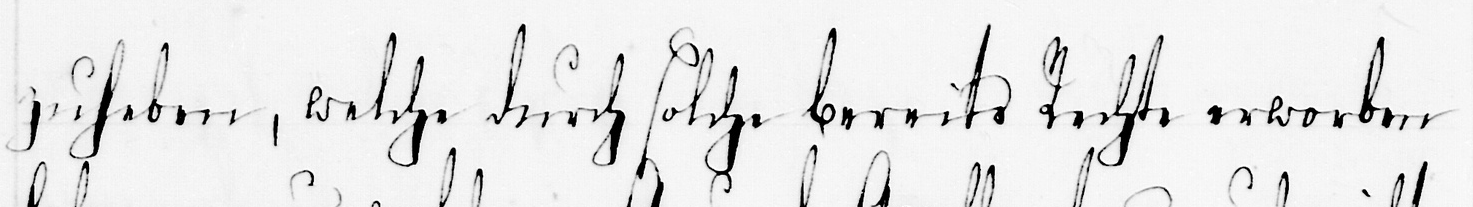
zuheben, welche durch solche bereits Rechte erworben
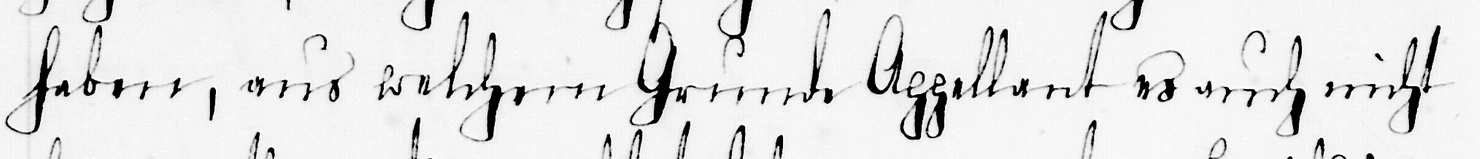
haben, aus welchem Grunde Appellant es auch nicht
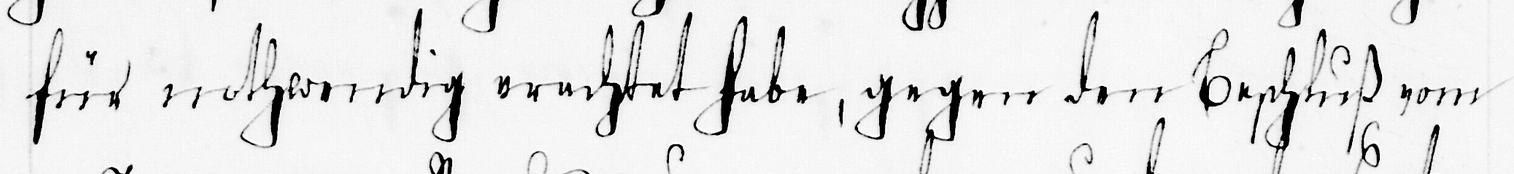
für nothwendig erachtet habe, gegen den Beschluß vom
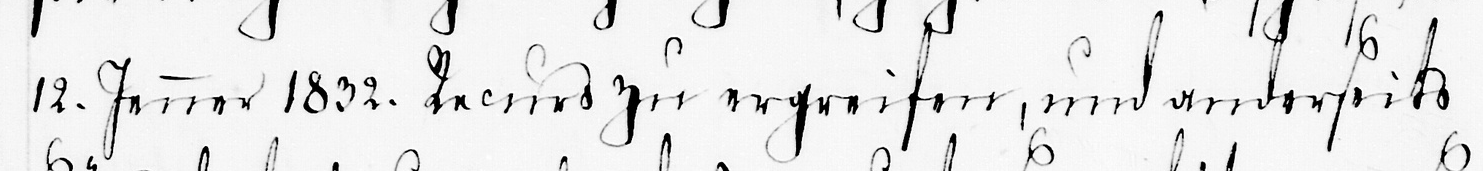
12. Jenner 1832. Recurs zu ergreifen, und anderseits
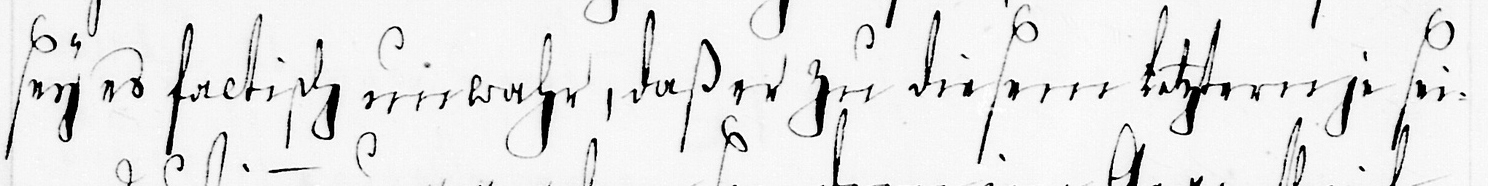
sey es factisch unwahr, daß er zu diesem Letztern je sei¬
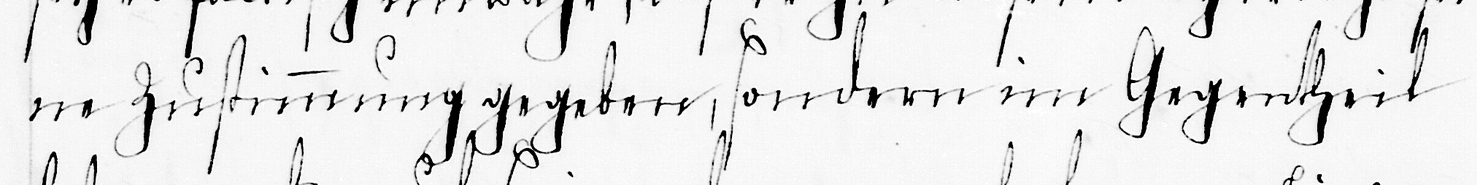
ne Zustimmung gegeben, sondern im Gegentheil
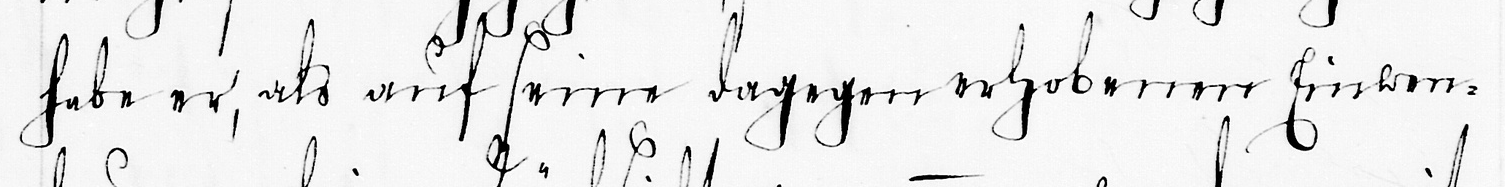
habe er, als auf seine dagegen erhobenen Einwen¬
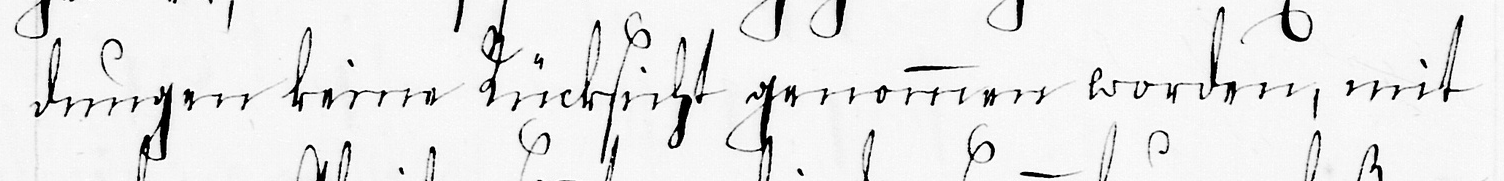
dungen keine Rücksicht genommen worden, mit
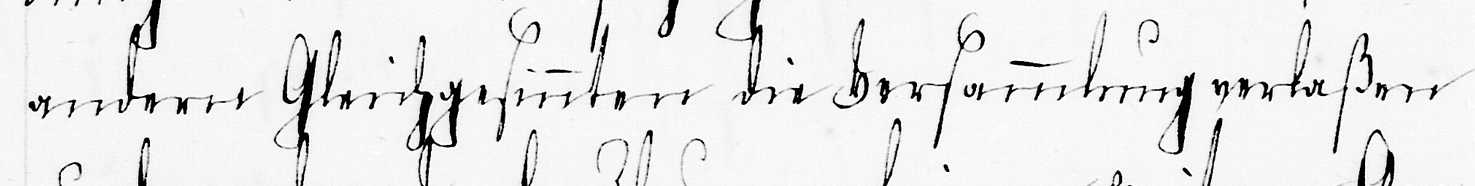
andern Gleichgesinnten die Versammlung verlaßen
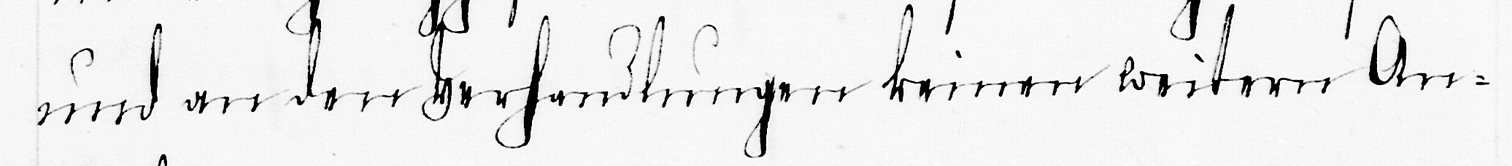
und an den Verhandlungen keinen weitern An¬
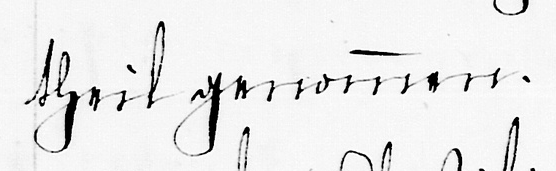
theil genommen.
